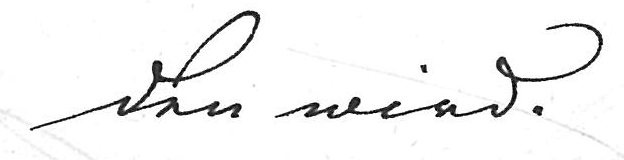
den wird.
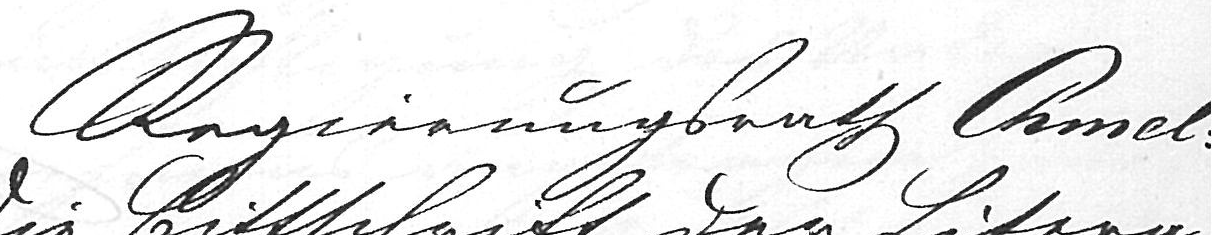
Regierungsrath Chmel:
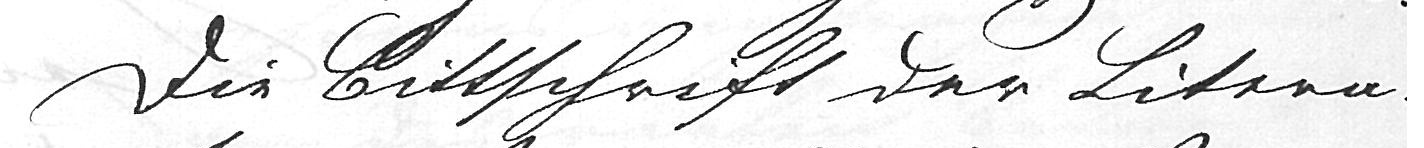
Die Bittschrift der Litera-
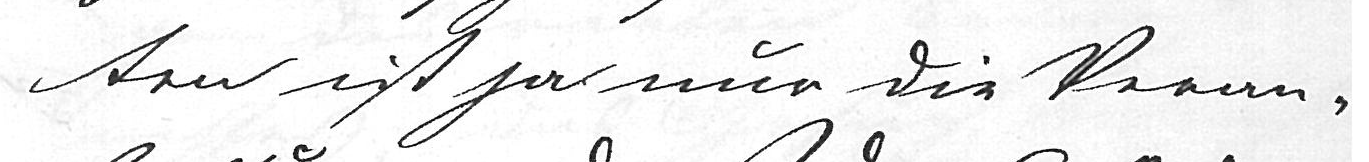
ten ist ja nur die Veran-
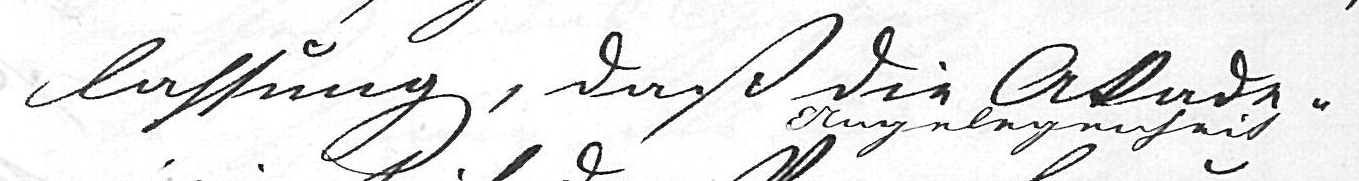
lassung, daß die Akade-
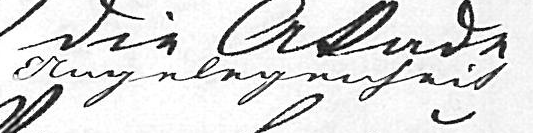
Angelegenheit
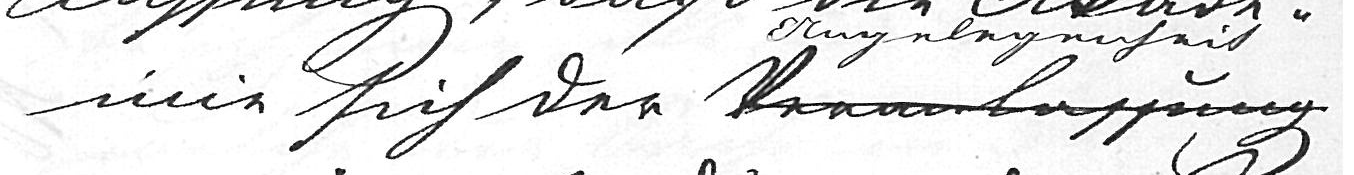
mie sich der Veranlassung
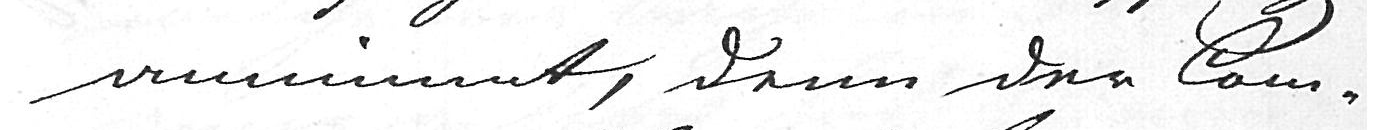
erinnert, denn der Com-
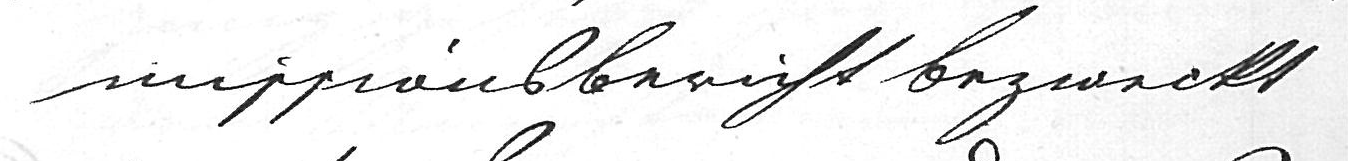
missionsbericht bezweckt
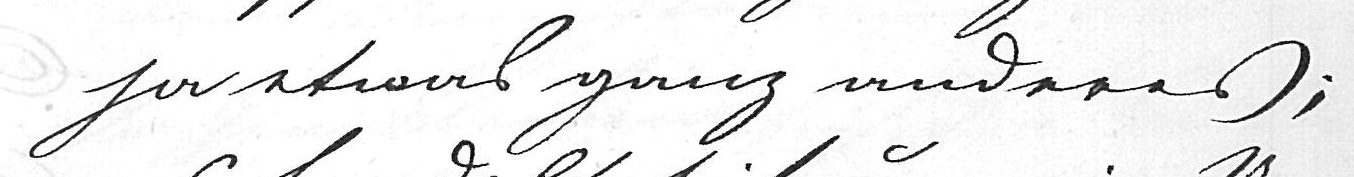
ja etwas ganz anderen;
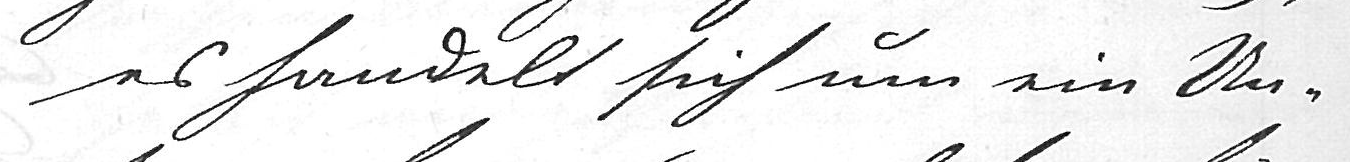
es handelt sich um ein Un-
